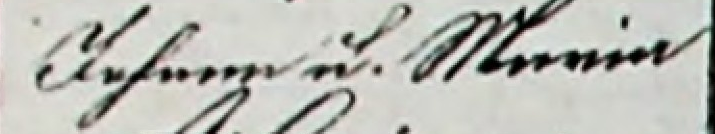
Johann u. Maria
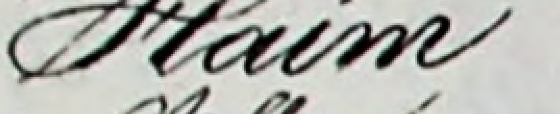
Haim
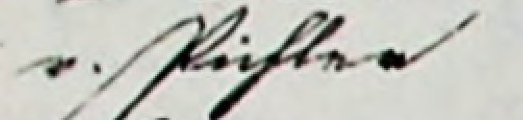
v. Pichter
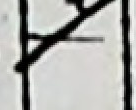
7
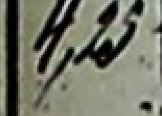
4,25
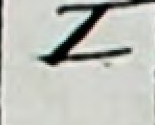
I
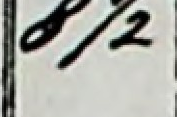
8 1/2
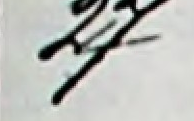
27
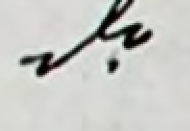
do
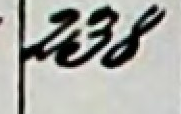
238
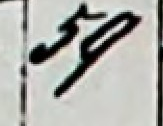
59
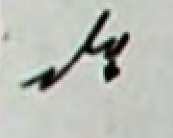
do
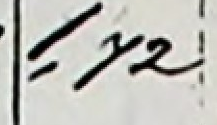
1,72
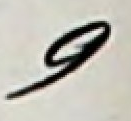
9
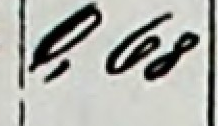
0,68
